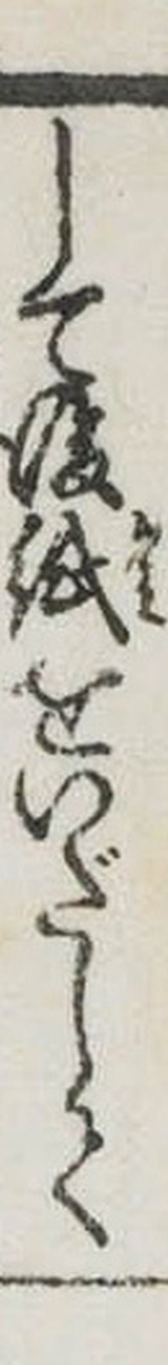して後紙をいだして
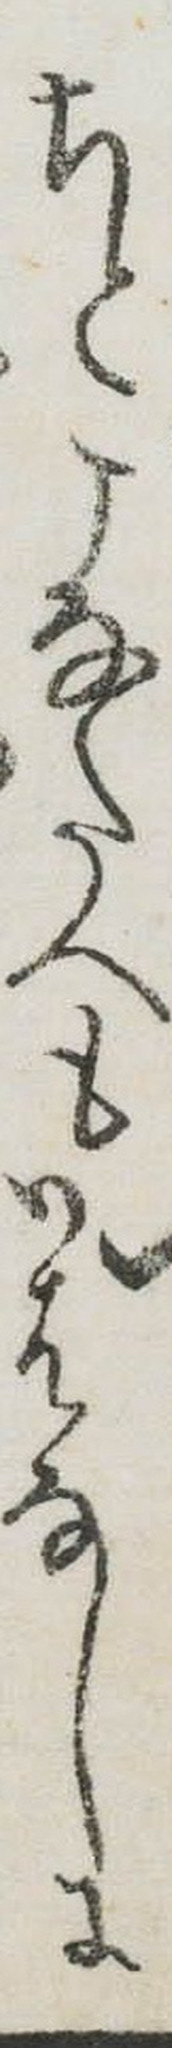ちとこなたへも御はなしに
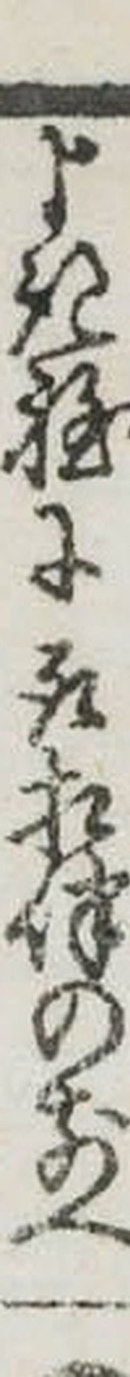よき程に取相伴の前へ
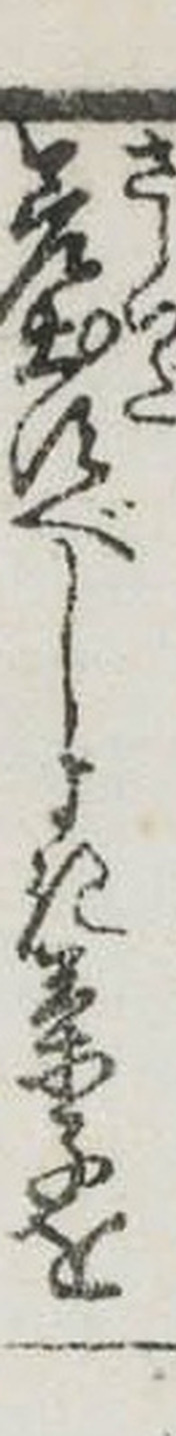差出すべしよき菓子を
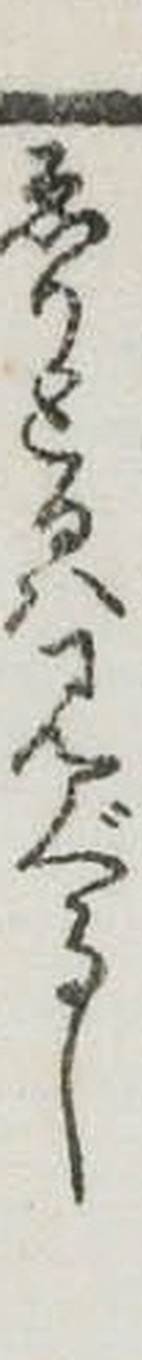ゑりとるは見ぐるし
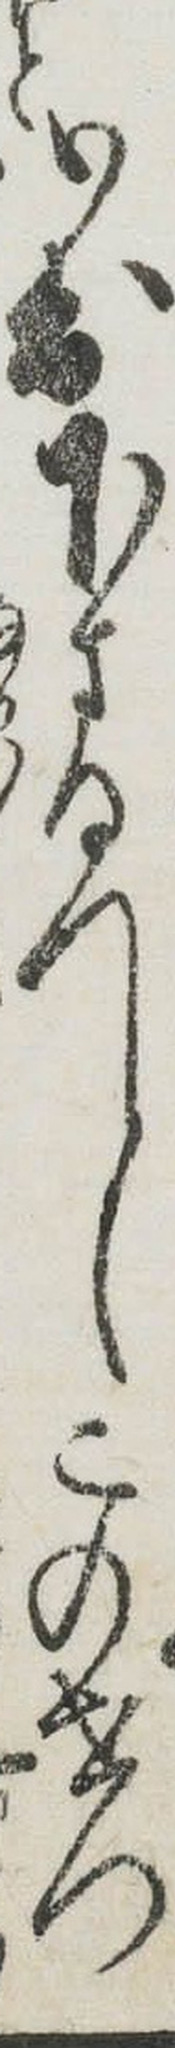御出下さるべく候このせつ
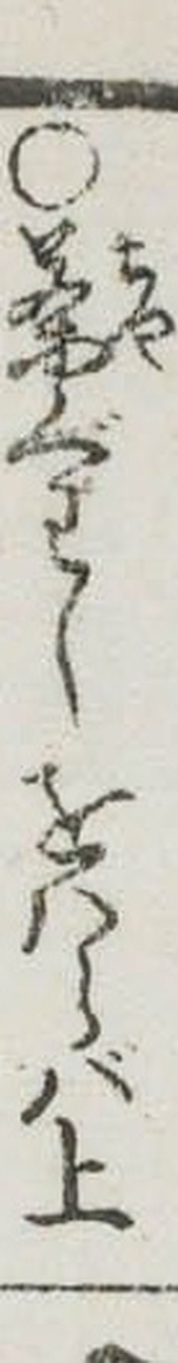○茶ぐはしをはらば上
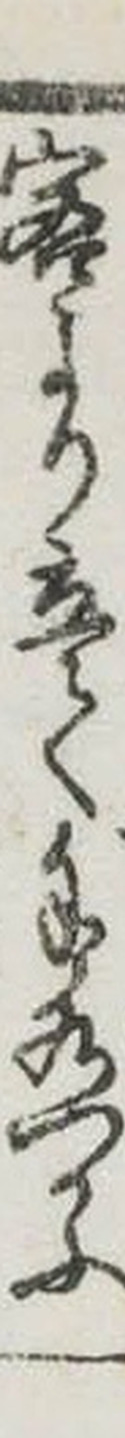客より立て手水つかふ
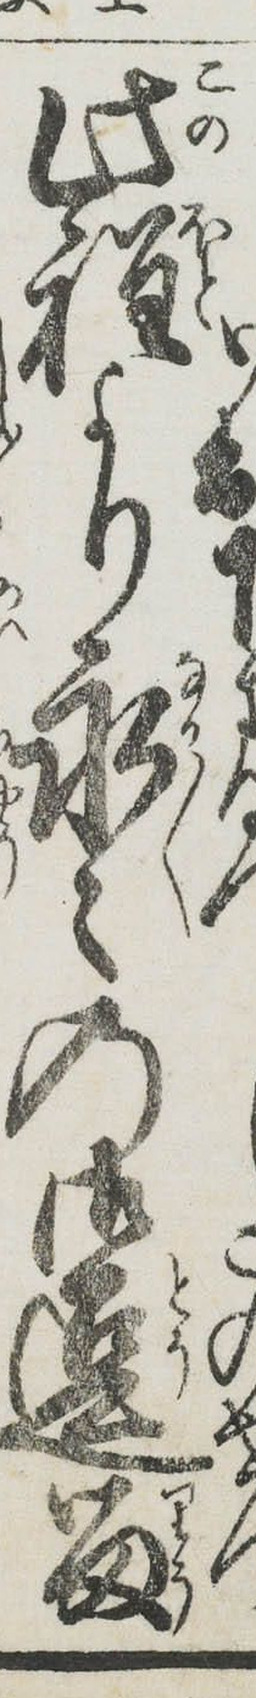此程より永々の御逗留
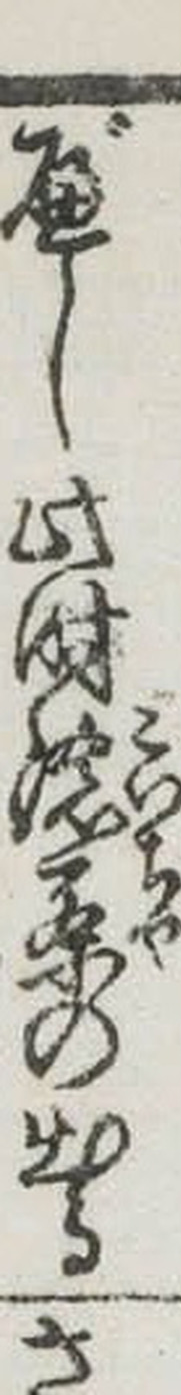べし此時濃茶の出る
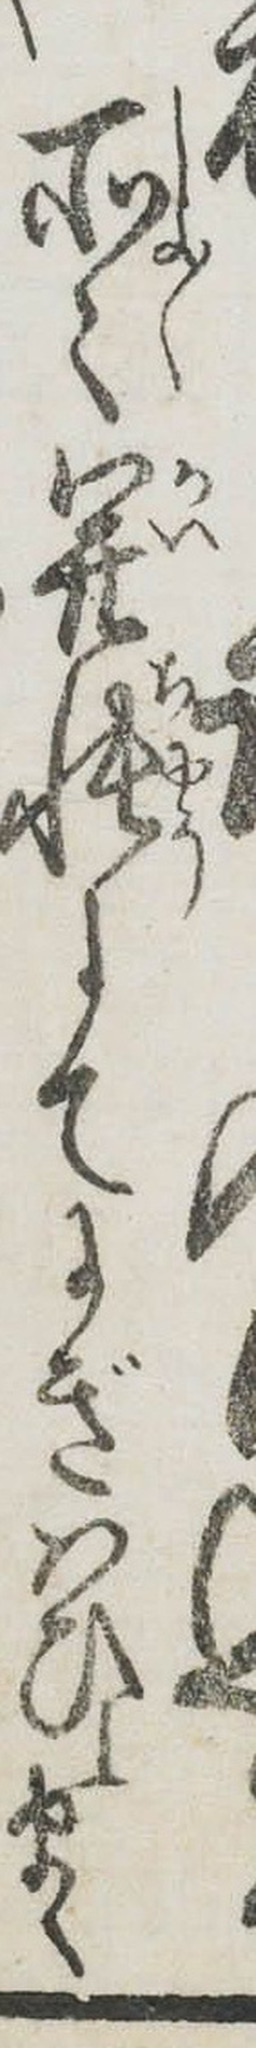所々開帳にてにぎはひ候まゝ
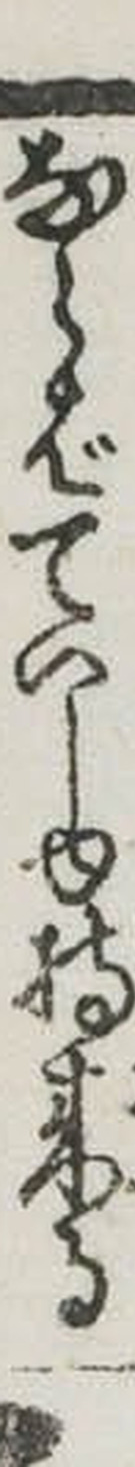ならばていしゆ持来る
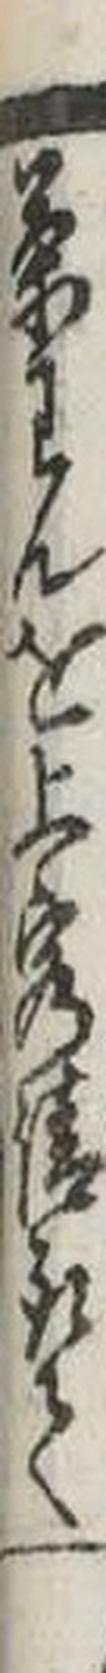茶わんを上客請取て
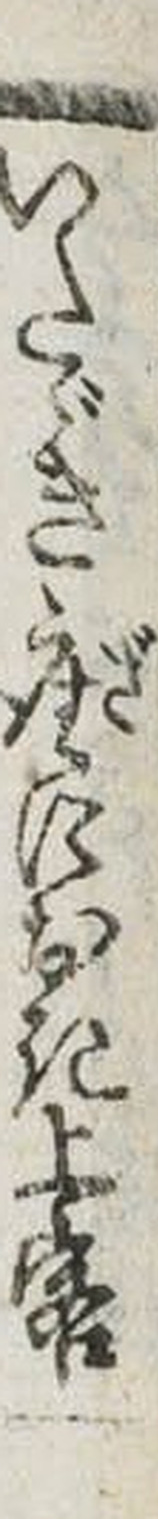いたゞき座におき上客
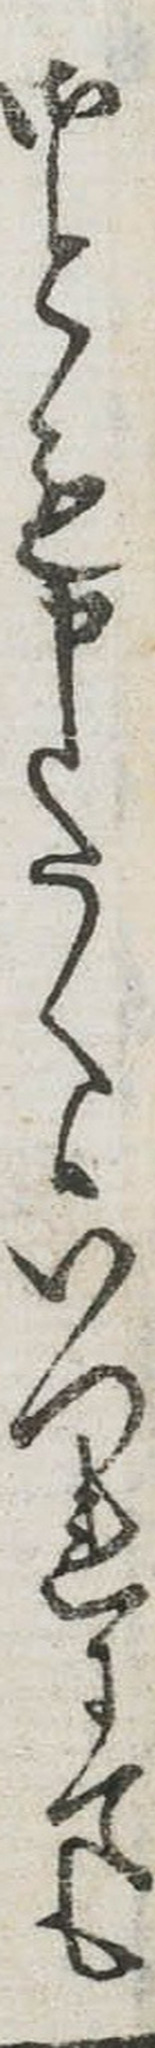御とも申たく候いつれにても
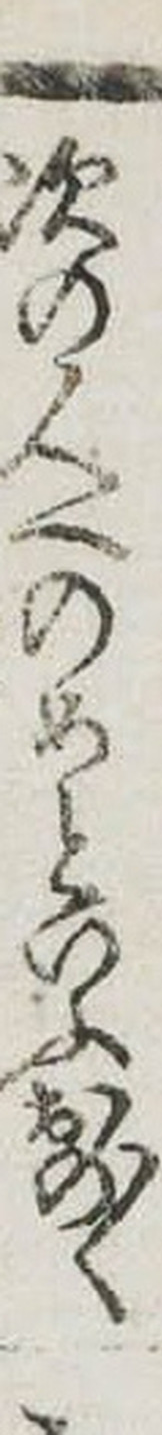次の人へのめといふおの〳〵
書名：頭書萬用婦人手紙之文言
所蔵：東京学芸大学教育コンテンツアーカイブ
